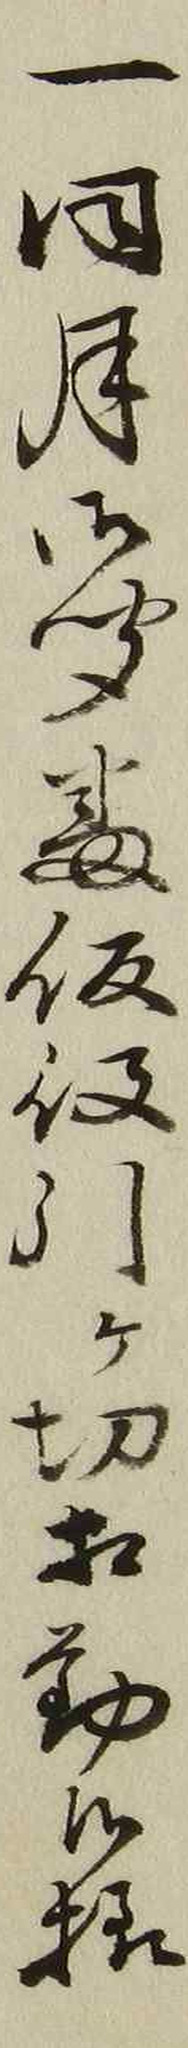一同月御聞番仮役引ヶ切相勤候様
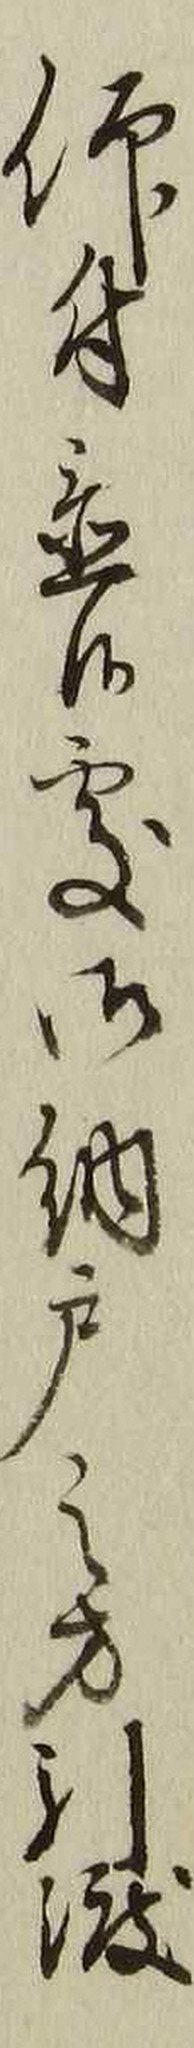被仰付置候処御納戸之方引渡
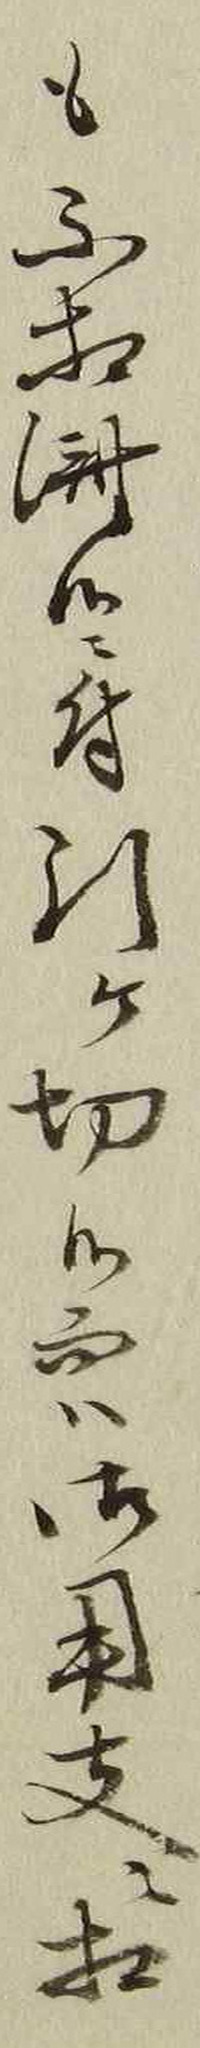も不相済候ニ付引ヶ切候而ハ御用支ニ相
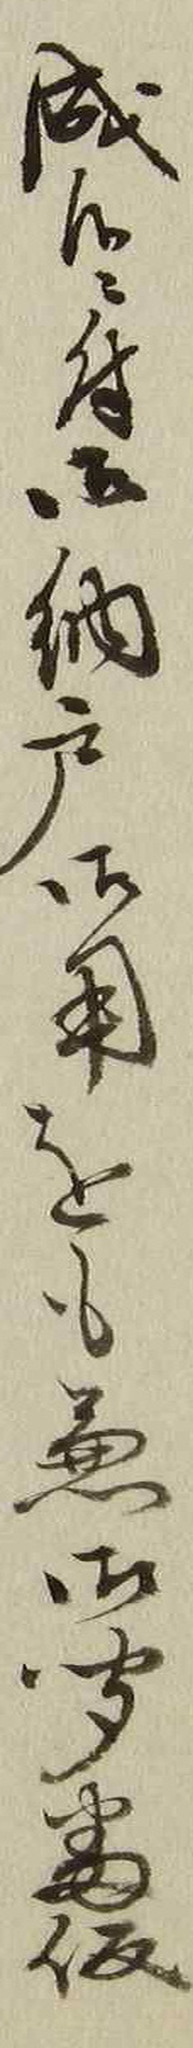成候ニ付御納戸御用をも兼御聞番仮
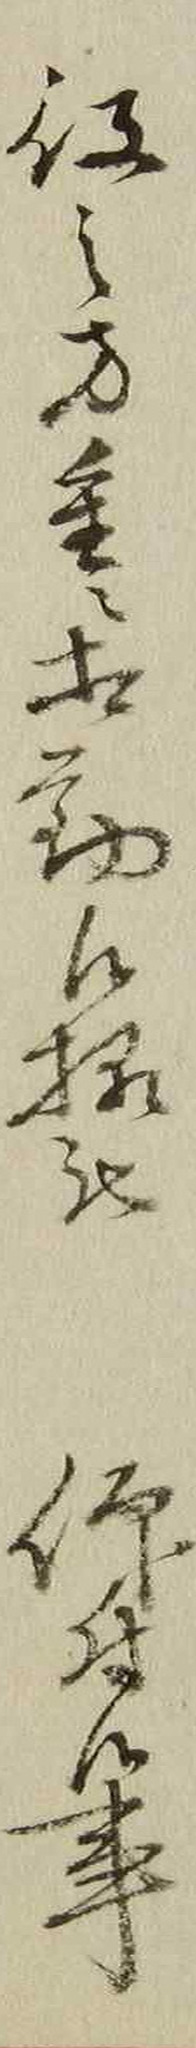役之方重ニ相勤候様被仰付候事
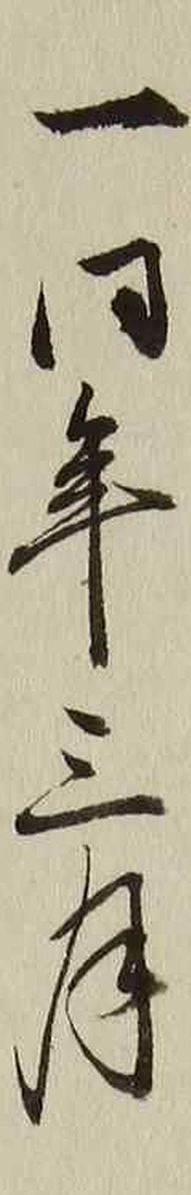一同年三月
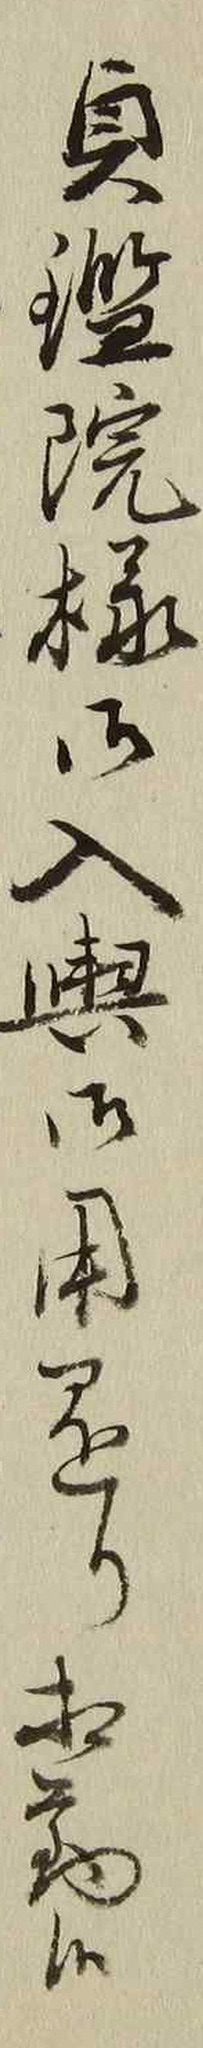貞鑑院様御入輿御用懸り相勤候
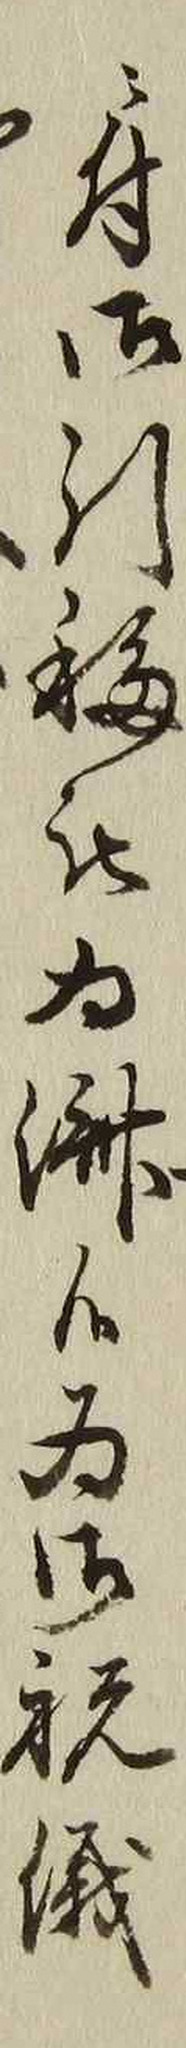ニ付御引移被為済候為御祝儀
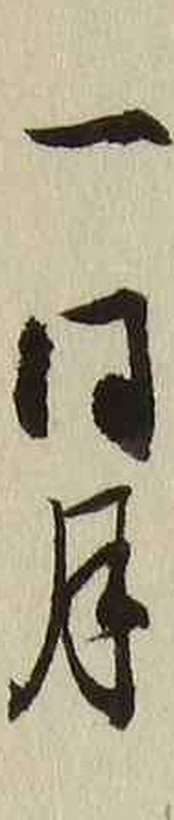一同月
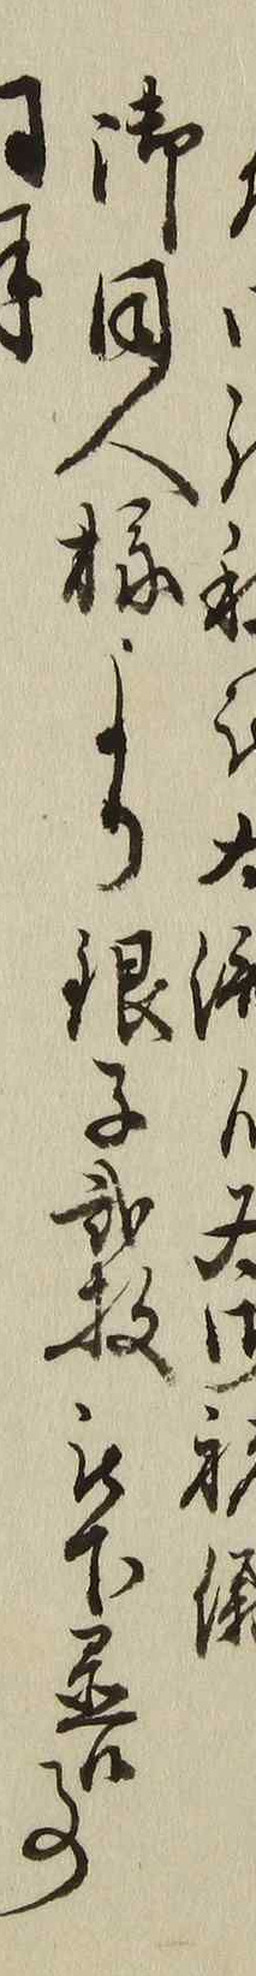御同人様より銀子弐枚被下置候事
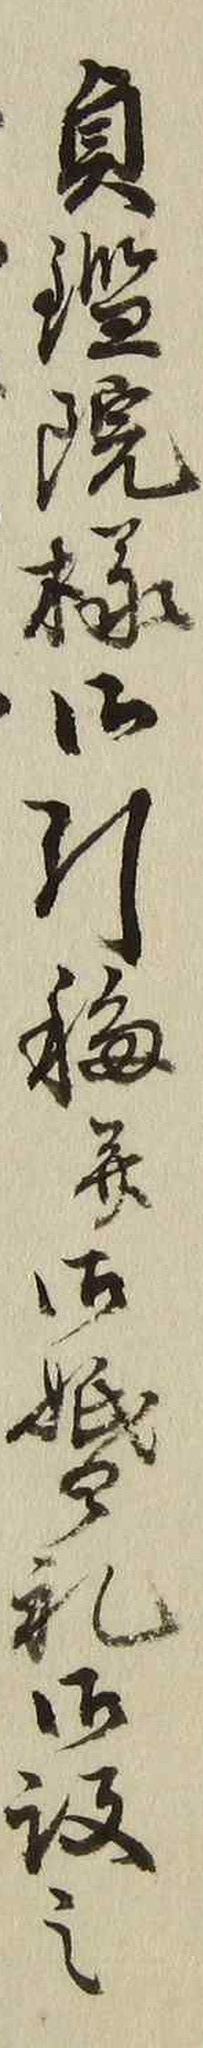貞鑑院様御引移并御婚礼御設之
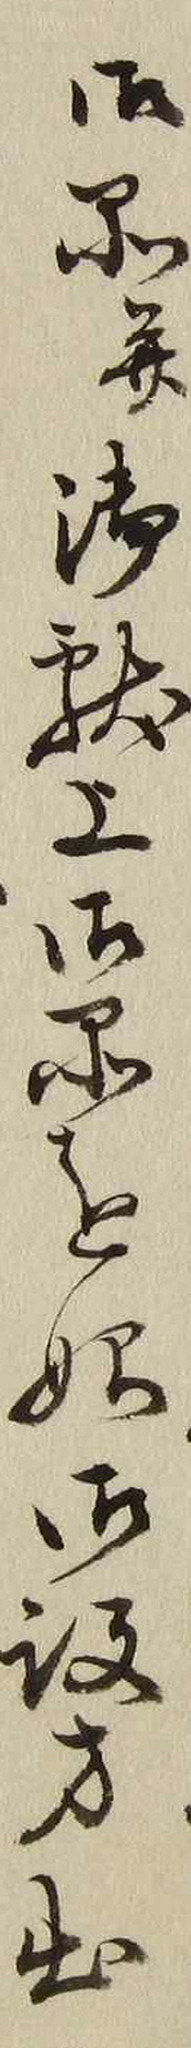御品并御献上御品を始御設方出
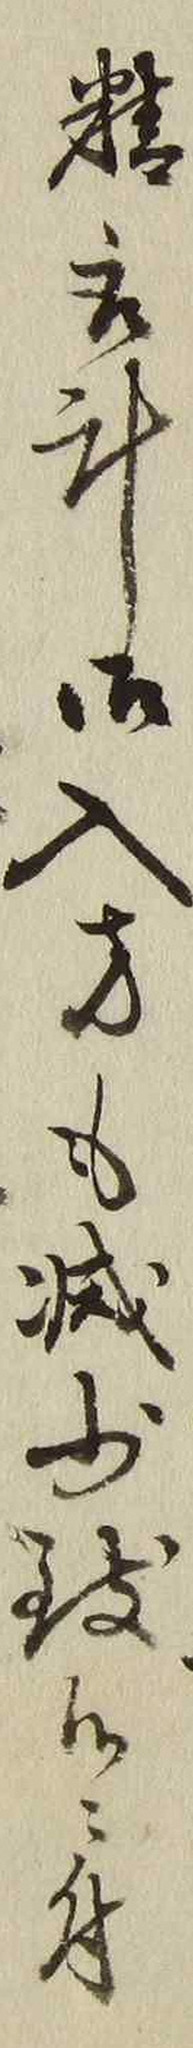精取計御入方も減少致候ニ付
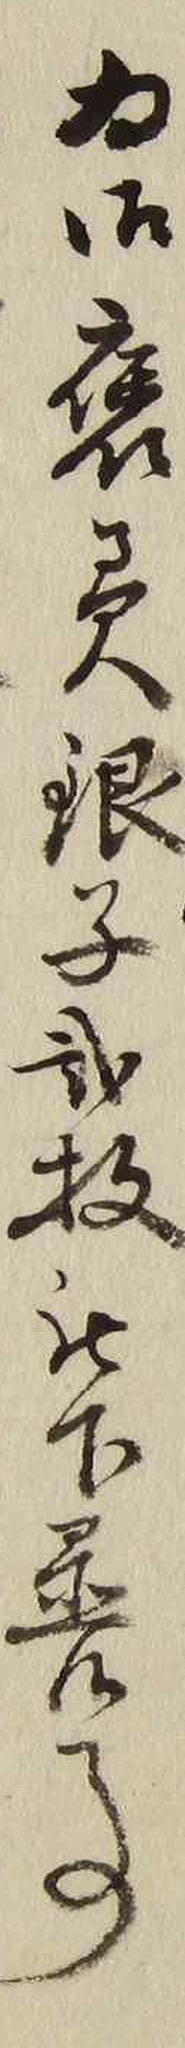為御褒美銀子弐枚被下置候事
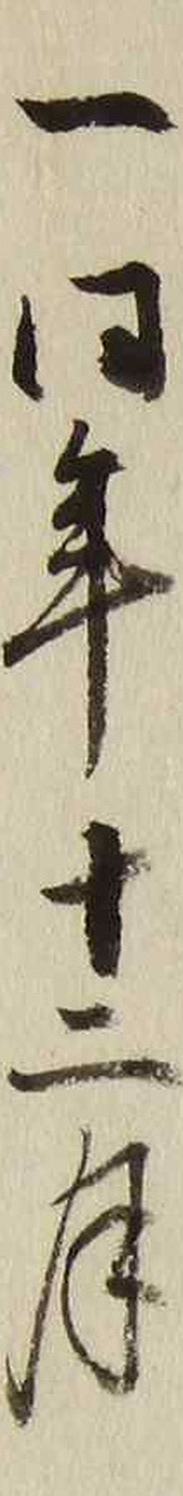一同年十二月
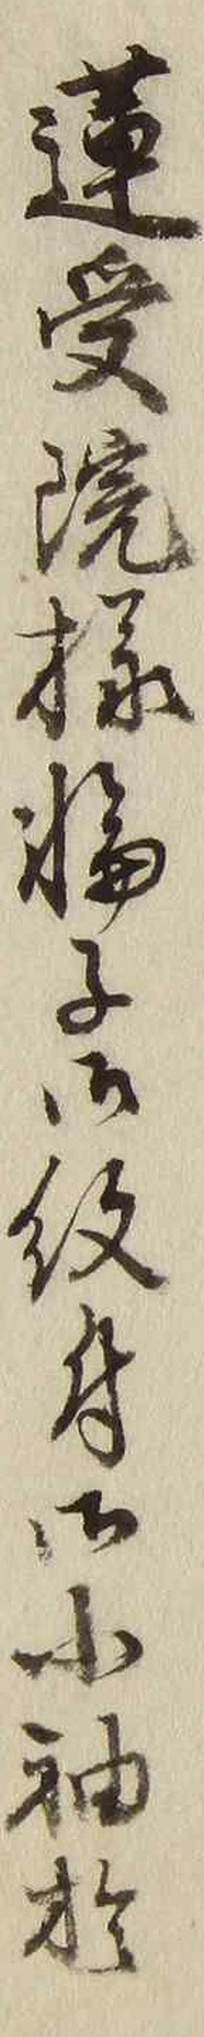蓮受院様輪子御紋付御小袖於
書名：諸士系譜　巻之35　は之部3
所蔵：会津若松市立会津図書館
